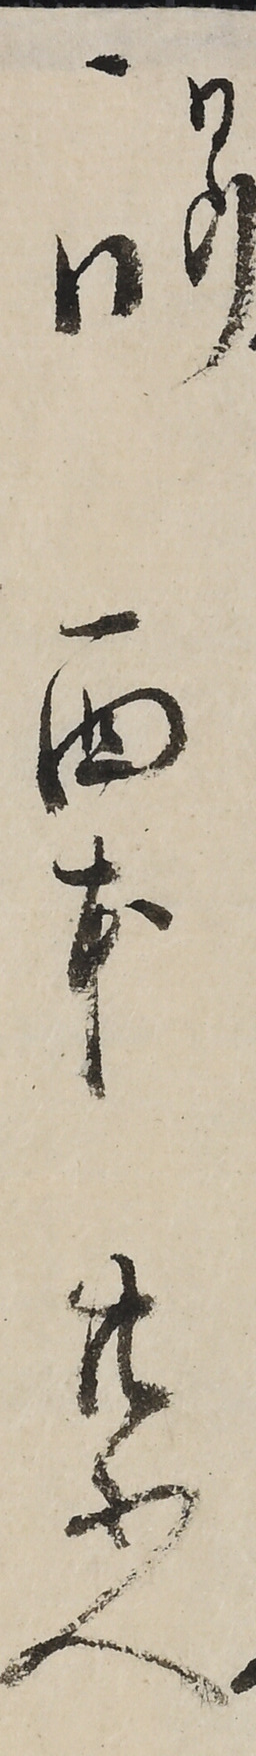一同西本廿五人
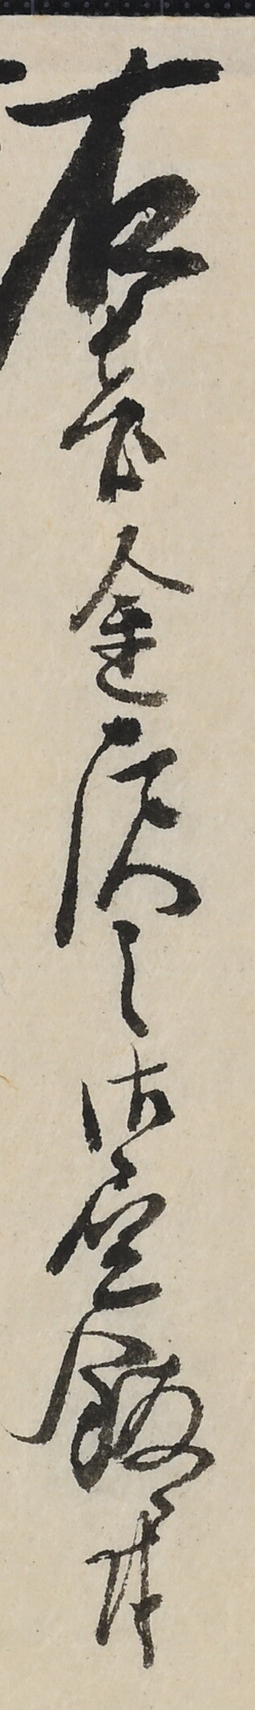一右は金沢之御昼飯ニ付
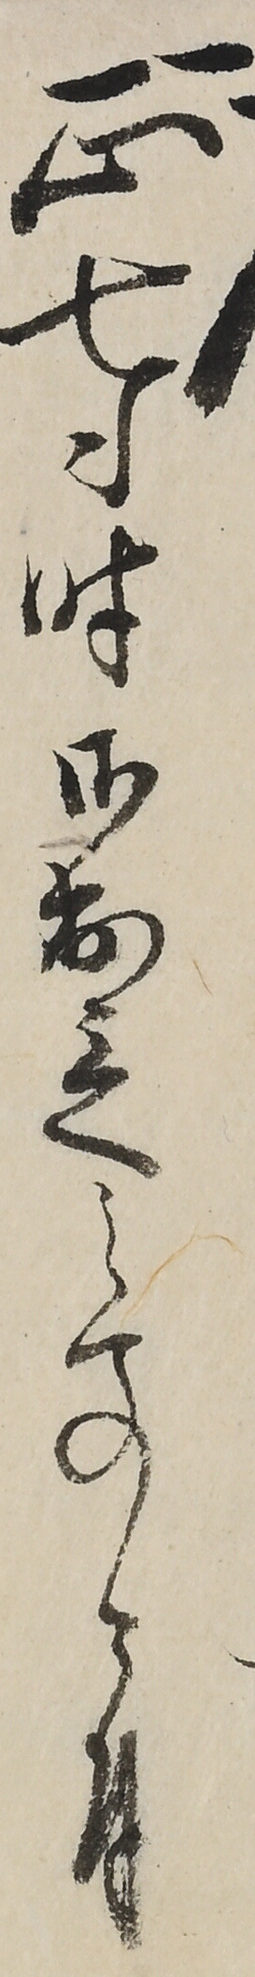正七ツ時御出立之事ニ付
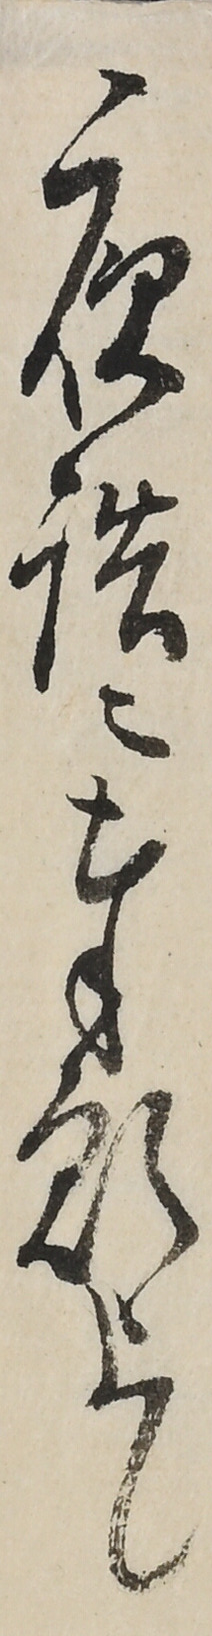夜詰ニ奉願上候
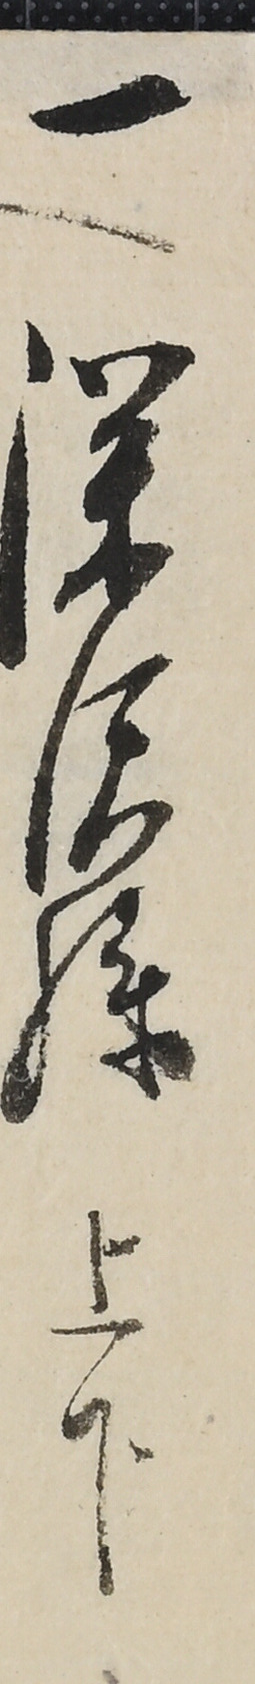一深沢様上下
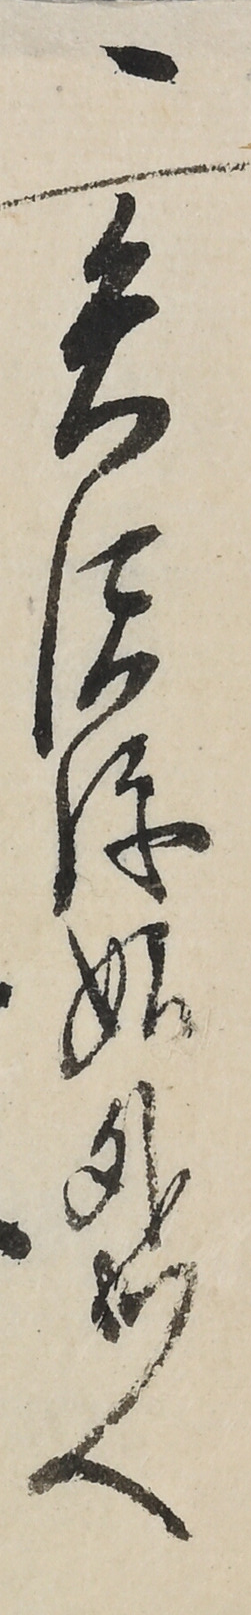一矢沢様始外弐人

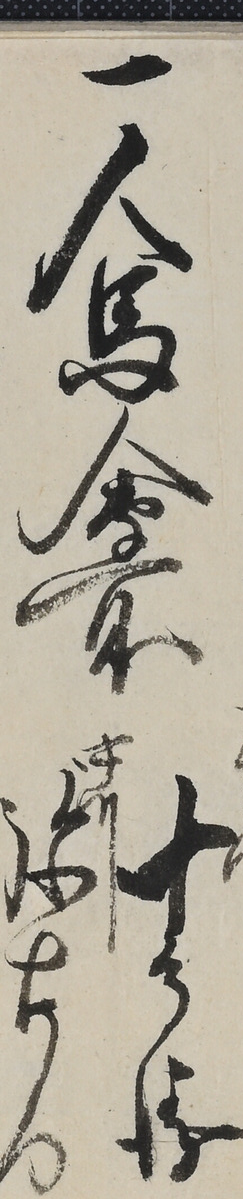一人馬会所十兵衛
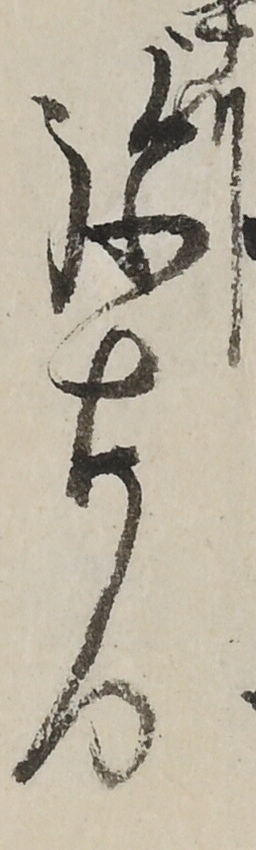弥右衛門
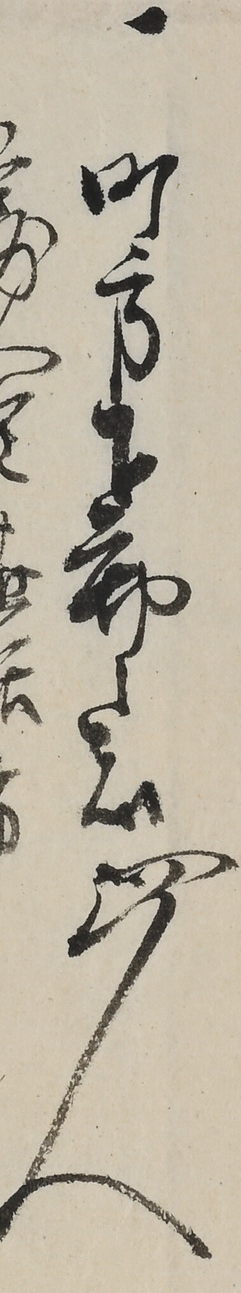一町方下勤之者四人
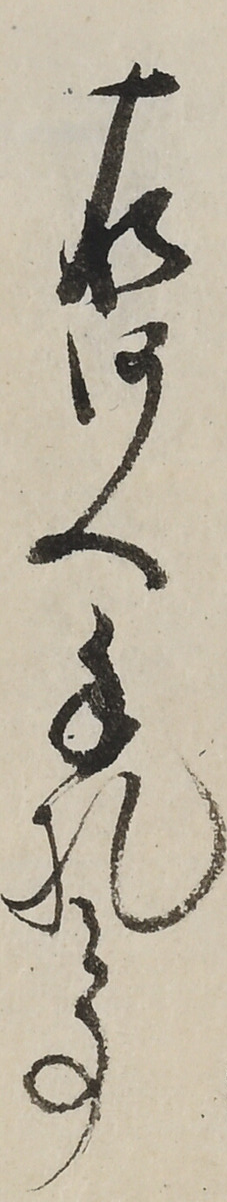右四人手札之事
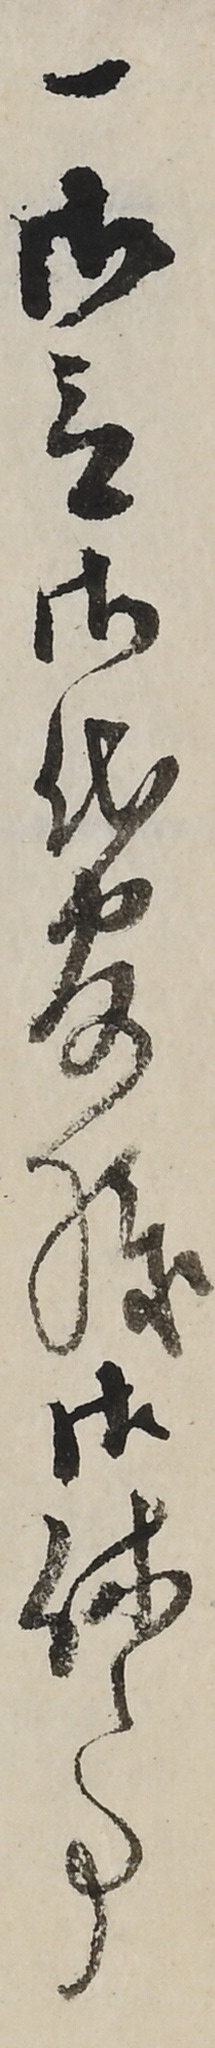一御壱御代官様御休之事

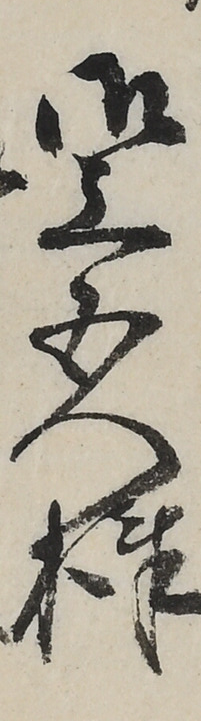御上五人様
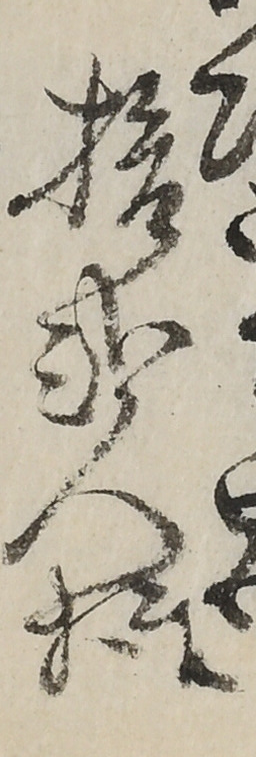拾弐人様
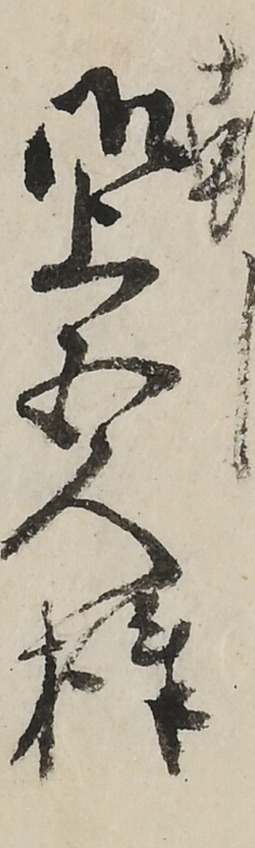御上五人様
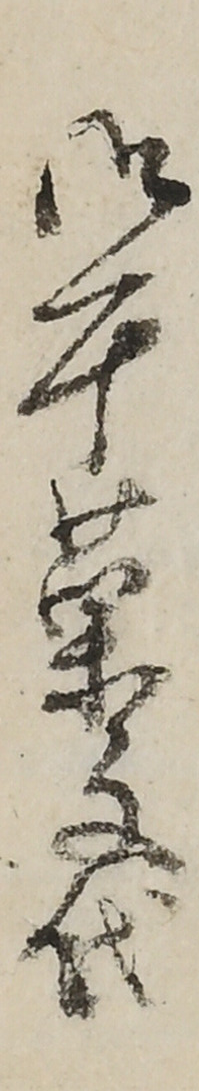御干菓子代
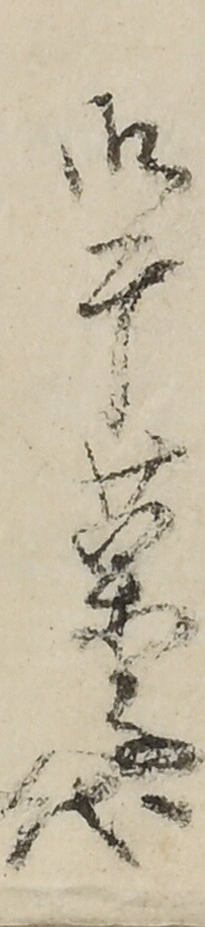御干菓子代
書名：御巡察様御泊御入用書上帳
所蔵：伊那市立高遠町図書館・合同会社AMANE
